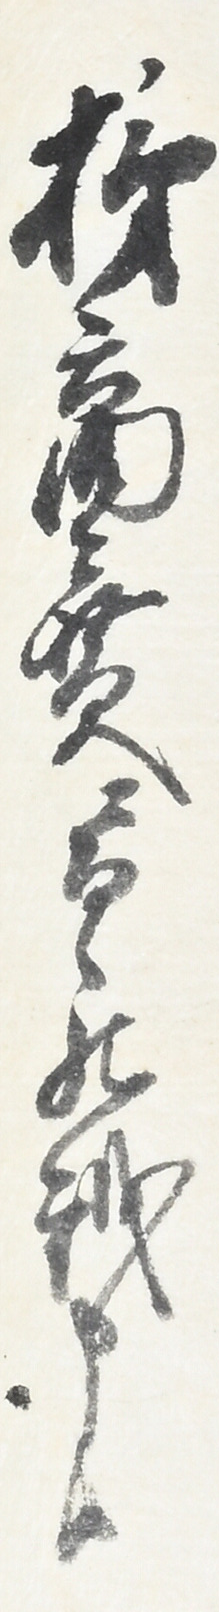梯商売ニ而罷越申候
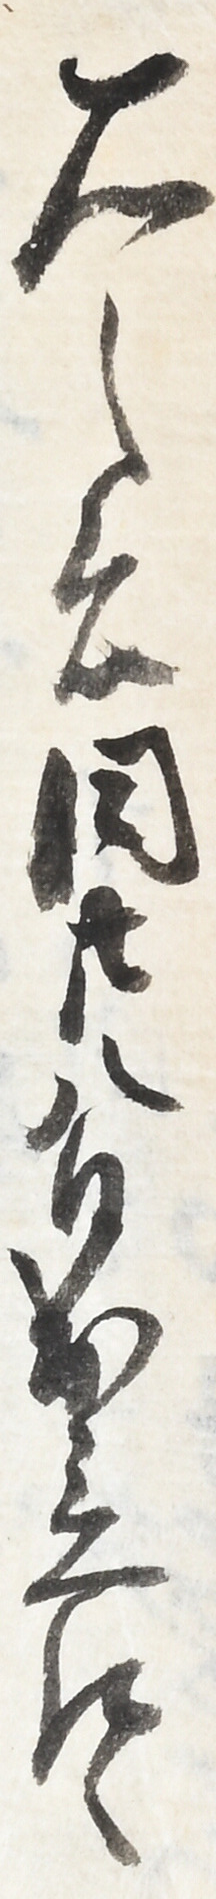右之者同廿五日出立仕候
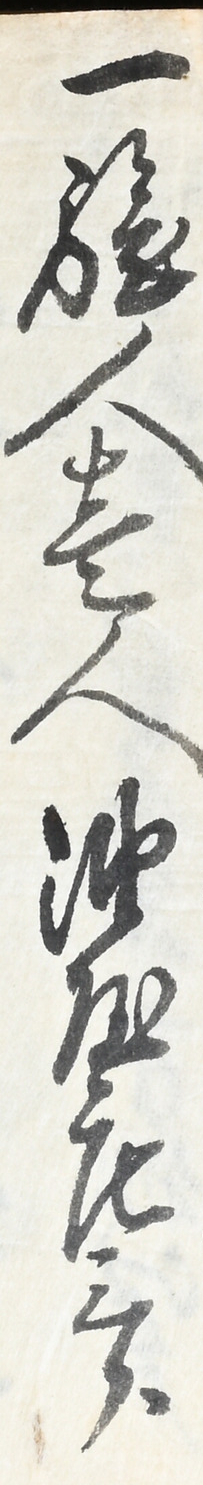一旅人壱人絹屋藤助

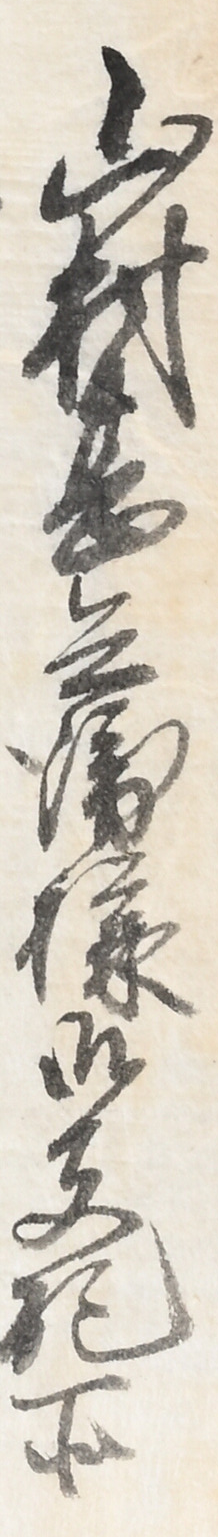山村甚兵衛様御支配所
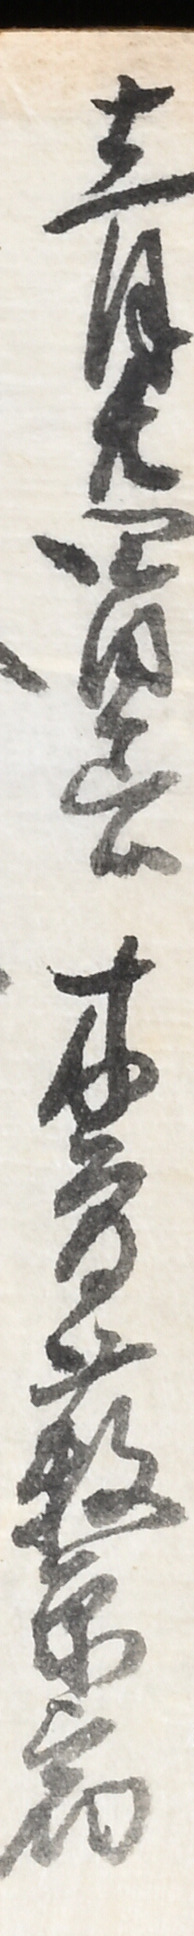十二月四日着木曽藪原宿
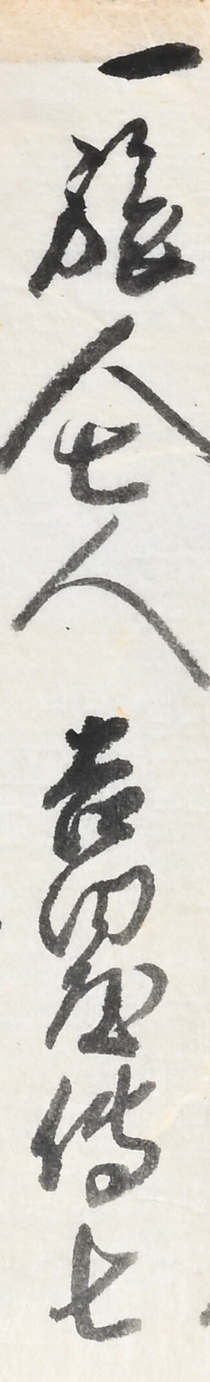一旅人七人吉田屋伝七
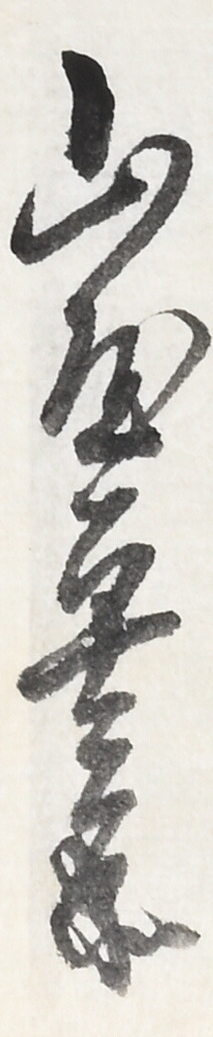山屋平兵衛
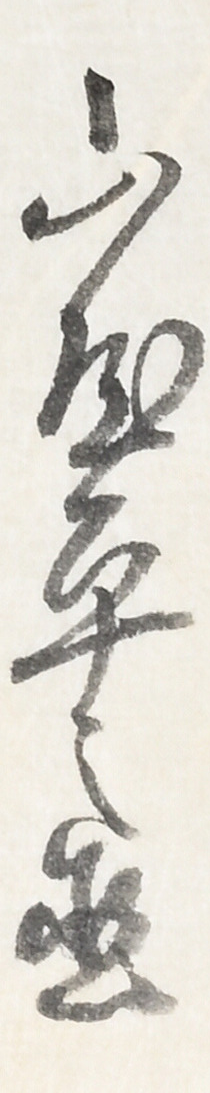山屋平之丞
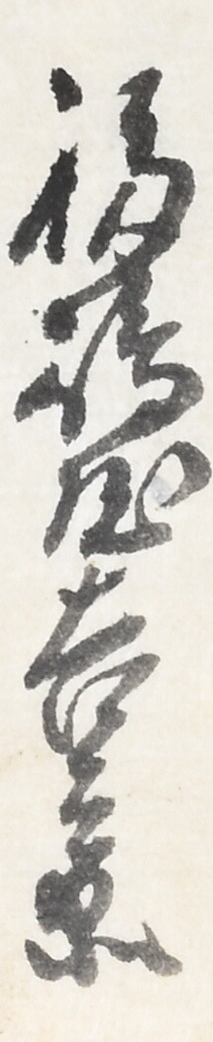福嶋屋吉兵衛
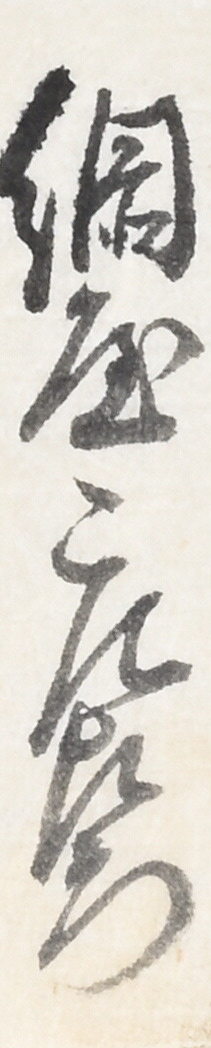網屋庄左衛門
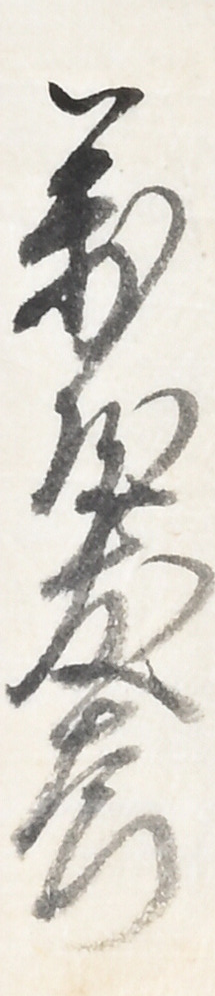万屋友右衛門
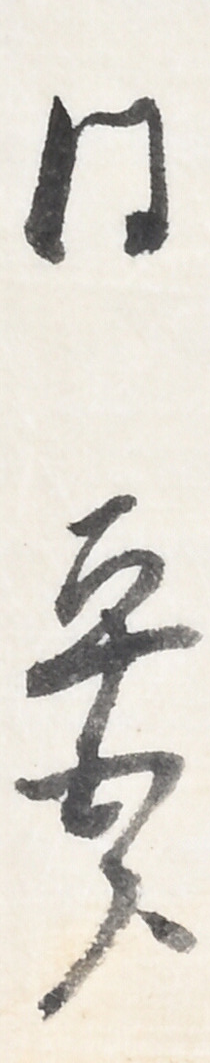同平五郎
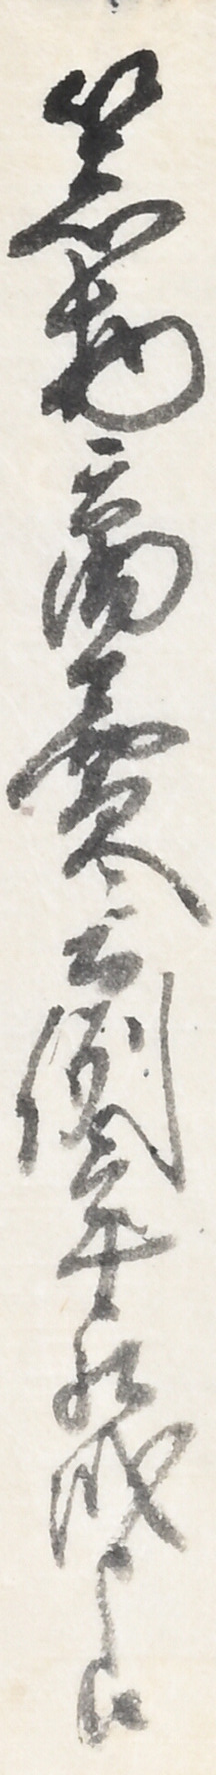器物商売ニ而例年罷越申候
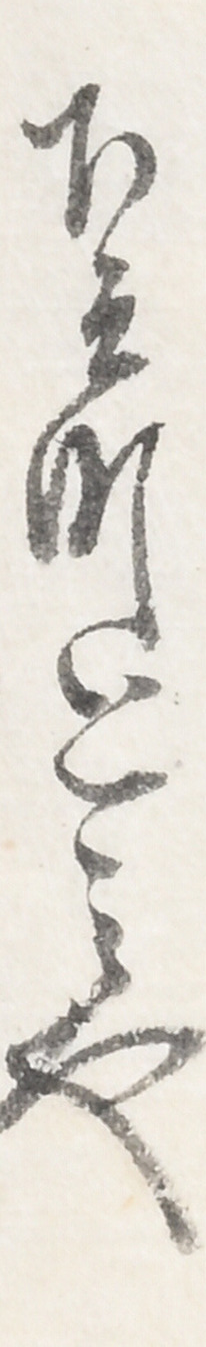下モ町とみや
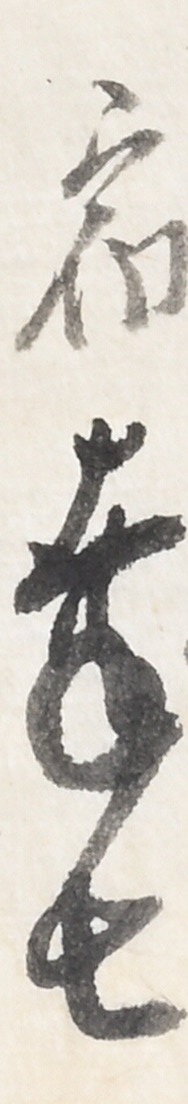宿幸七
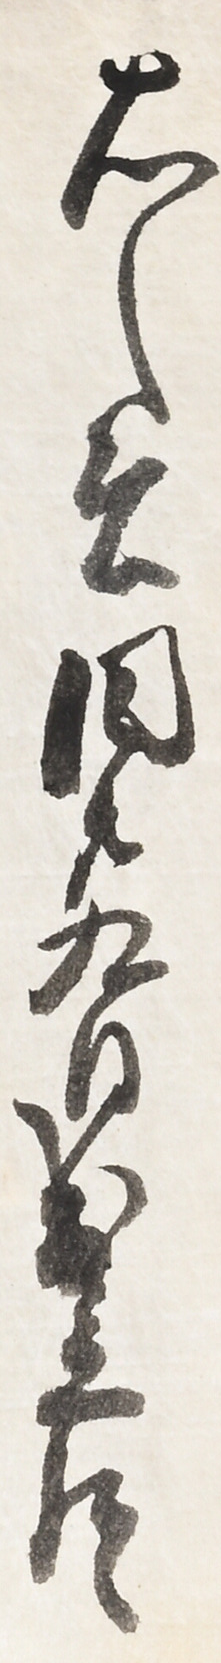右之者同廿九日出立仕候
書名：旅人泊控帳
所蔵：伊那市立高遠町図書館・合同会社AMANE
